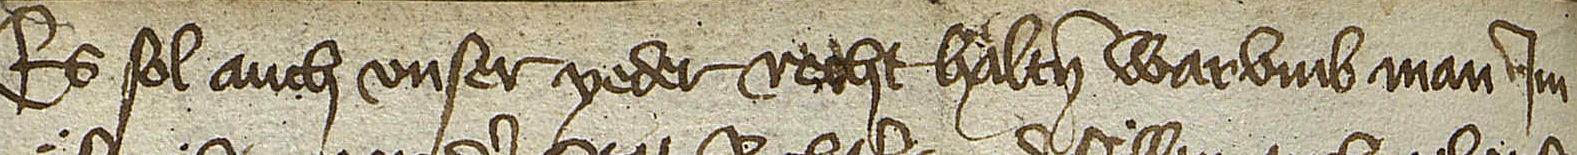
Es ſol auch vnſer yeder recht haltn* warvmb man Im
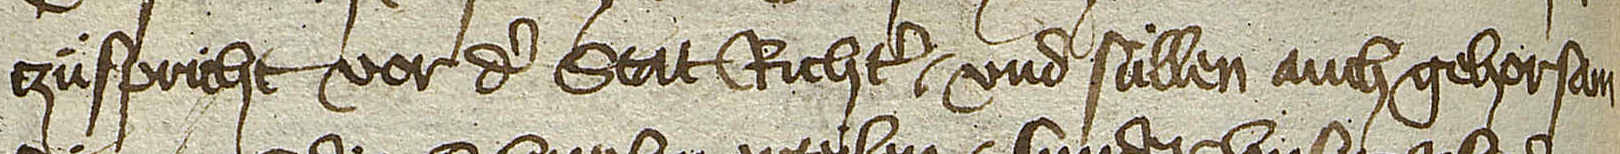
cʒüſpricht vor d* Stat Richt* / vnd ſüllen auch gehorſam
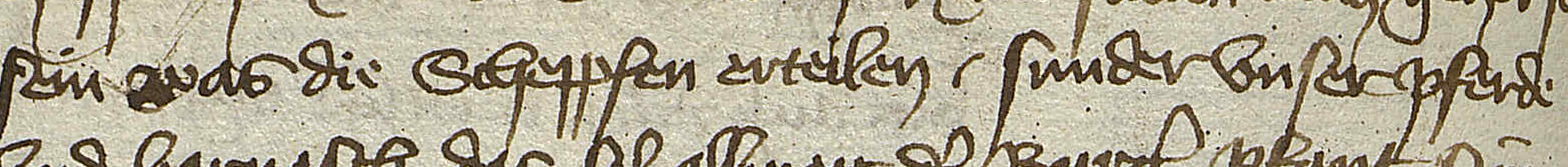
ſein was die Scheppfen erteilen / ſunder vnſer pferde
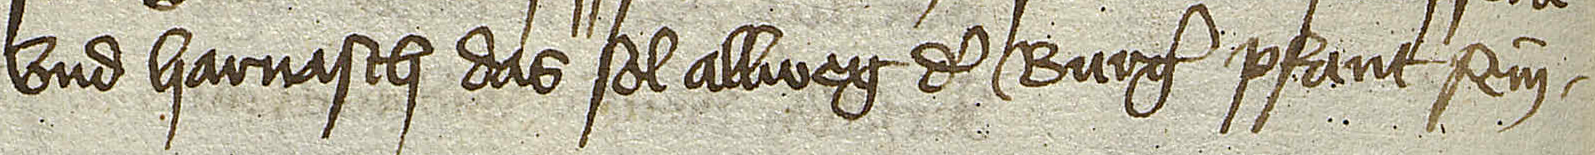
vnd harnaſch das ſol allweg d* Burg* pfant ſein /
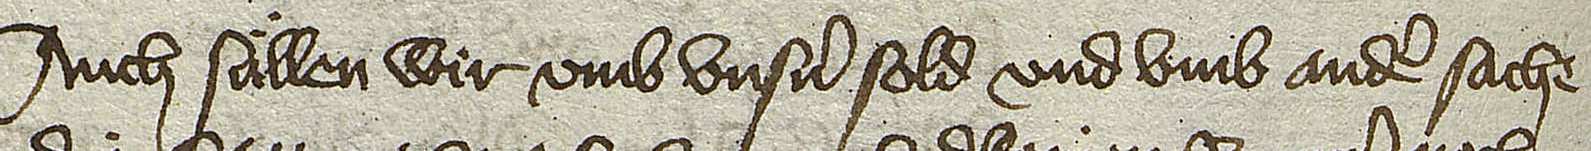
Auch ſöllen wir vmb vnſn* ſold vmb and* ſache
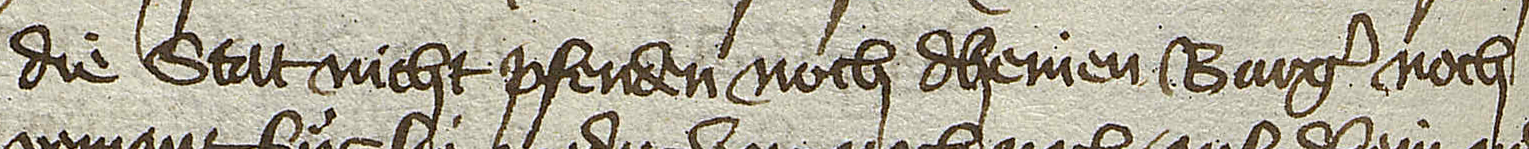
die Stat nicht pfenden noch dheinen Burg* noch
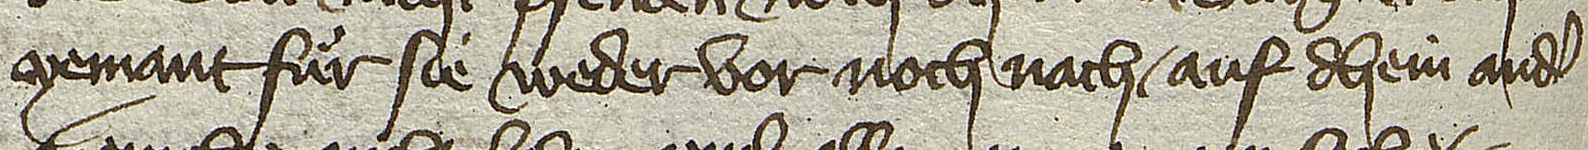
yemant für ſie weder vor noch nach / auf dhein and*
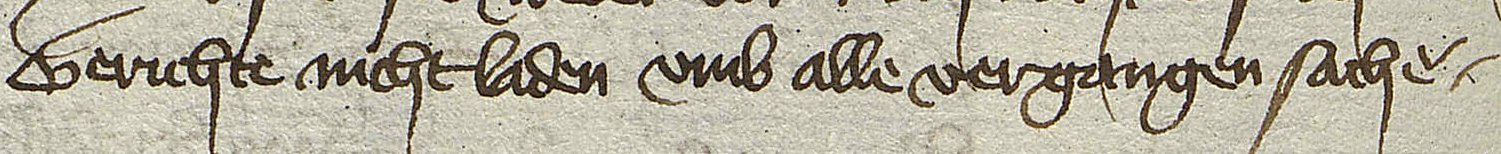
Gerichte nicht laden vmb alle vergangen ſache /
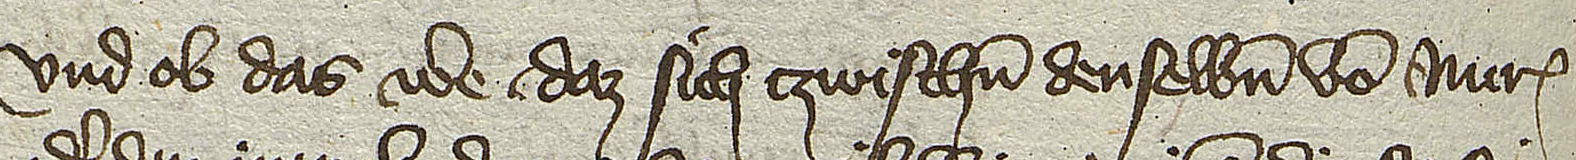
vnd ob das w*e / daʒ ſich cʒwiſchn* denſelbn* vo* Nur*
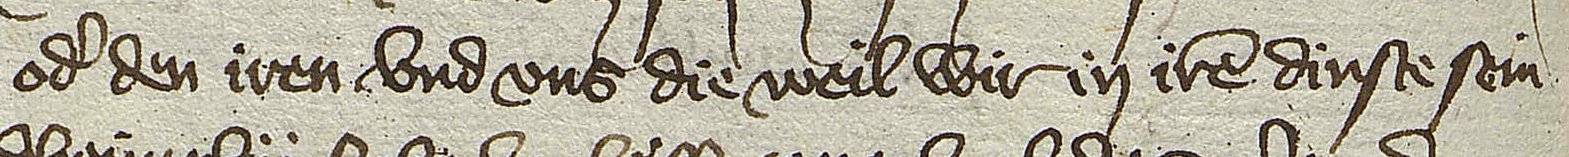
od* den iren / vnd vns die weil wir in ire* dinſte ſein
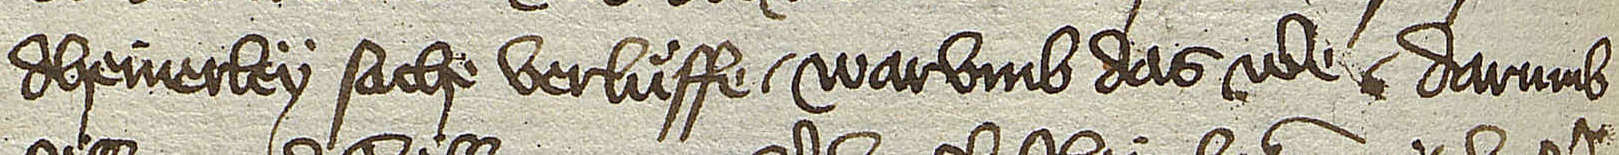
dheinerley ſache verlüffe / warvmb das w*e / darumb
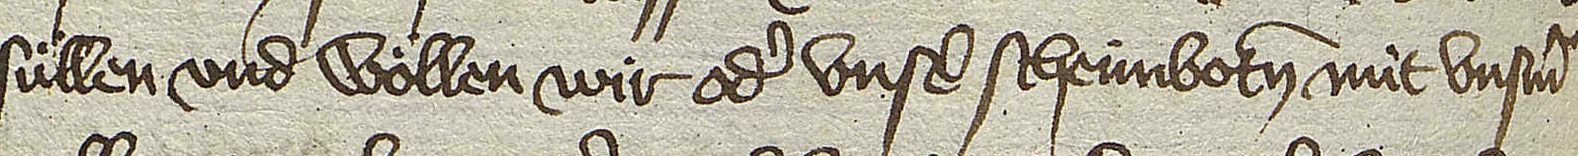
ſüllen vnd wöllen wir od* vnſe* ſcheinbotn* mit vnſm*
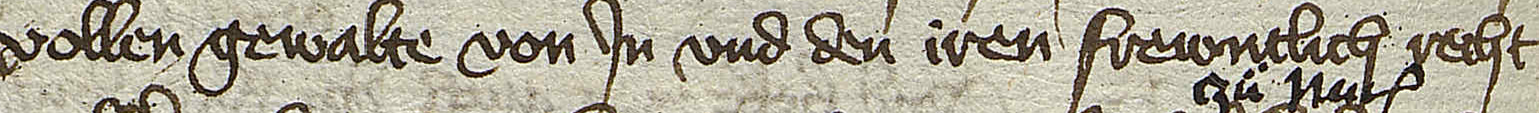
vollen gewalte von In vnd den iren frewntlich recht
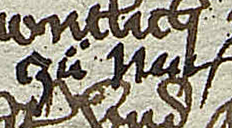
cʒü Nur*
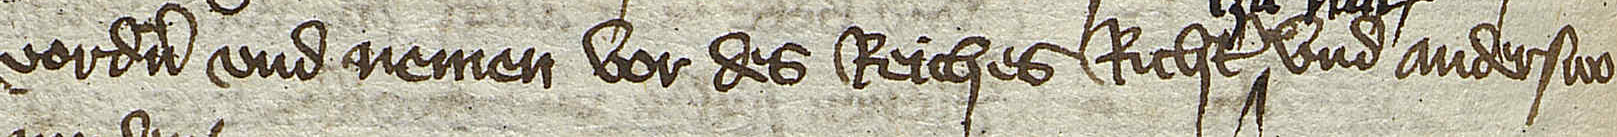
vordn* vnd nemen vor des Reiches Richt* vnd anderſwo
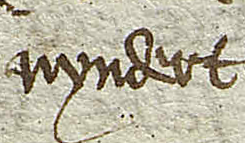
nyndert
